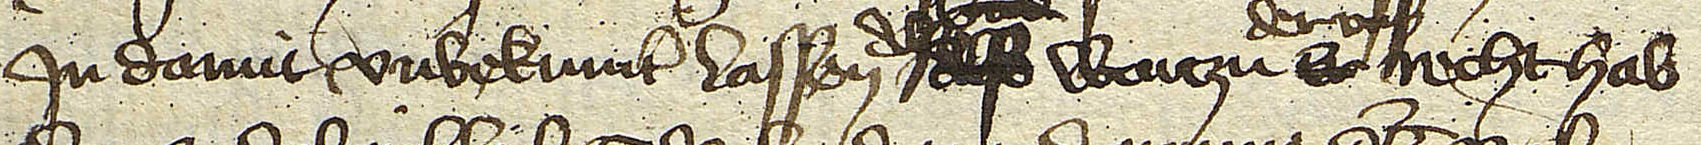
In damit vnbekumt* laſſen / Alſo warcʒu Er recht hab
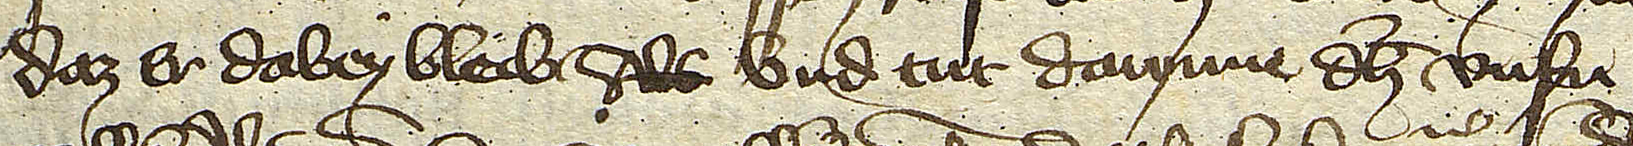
daʒ Er dabey bleib / Als vnd tut darynne d*h vnſ*n
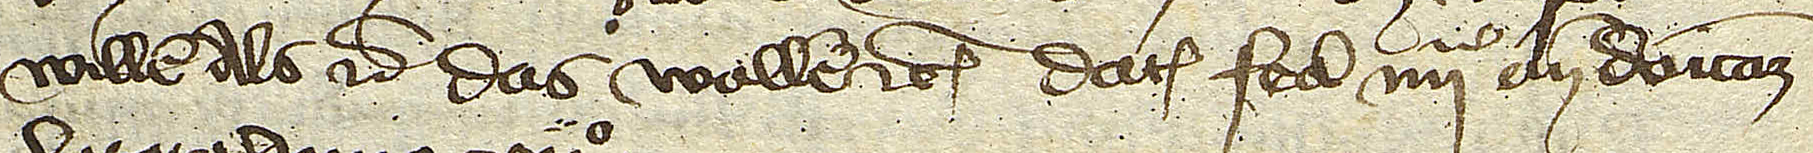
wille* Als ec* das wölle* ec* dat* fea* iiii* an* doica*
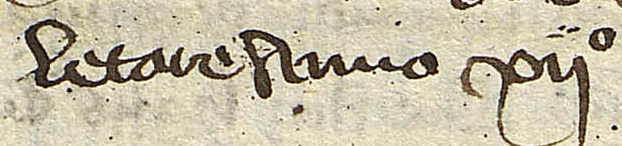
letare Anno xii*
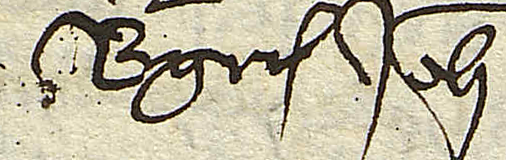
B*gr* Ioh*
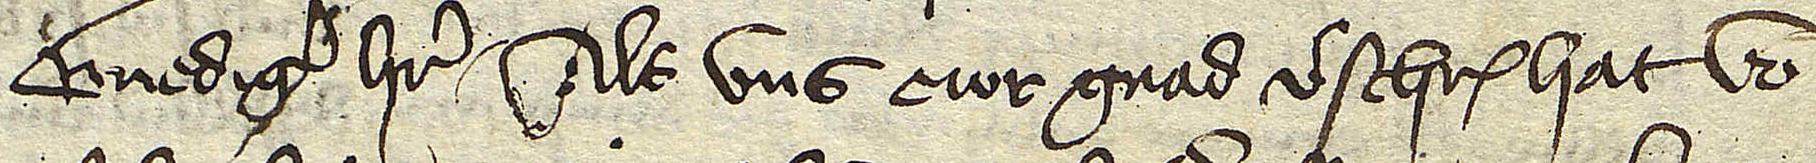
Gnedig* hr* / Als vns ewr gnad v*ſchr* hat vo*
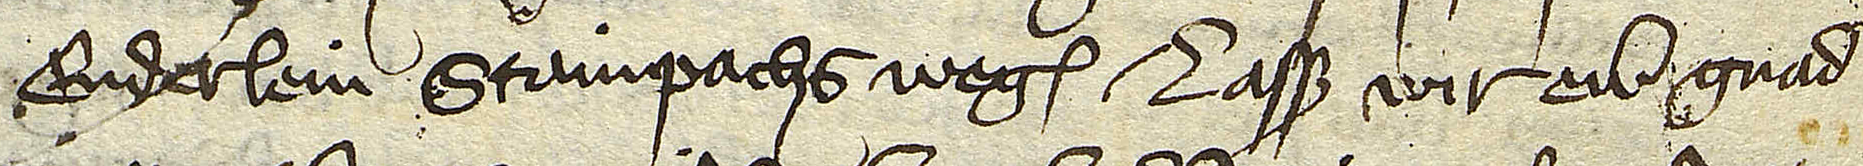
Enderlein Stainpachs weg* / Laſſ* wir ew* gnad
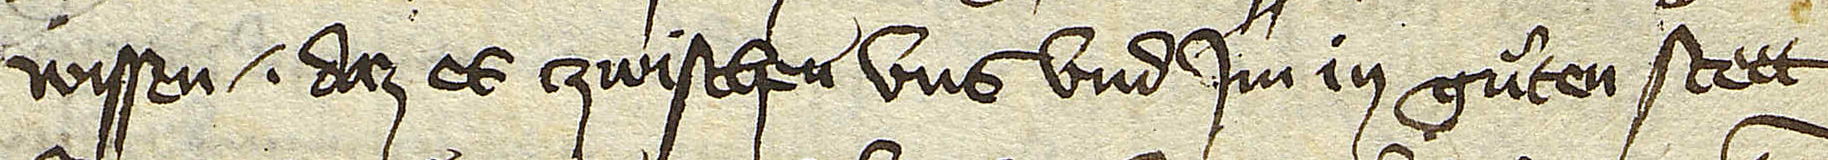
wiſſen / . daʒ es cʒwiſchen vns vnd Im in güten ſteet
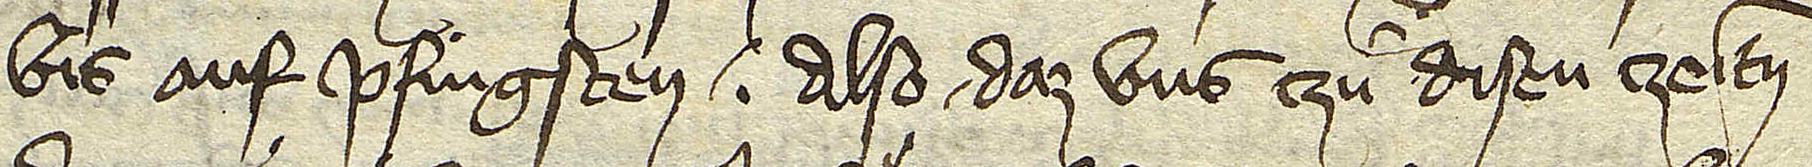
bis auf Pfingſten / . Alſo / daʒ vns cʒu diſen cʒeitn*
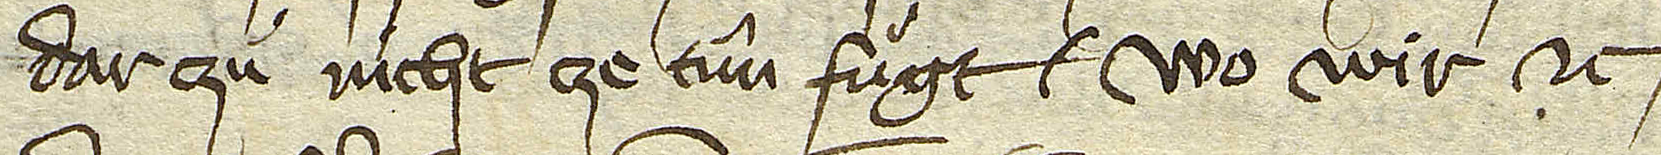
dar cʒü nicht cʒe tün fügt / wo wir ec*
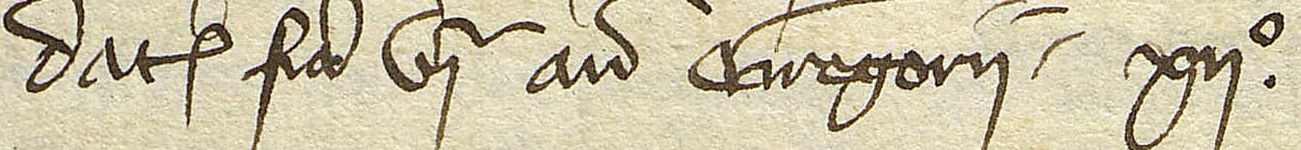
dat* fia* vi* an* Gregorii / xii* .
